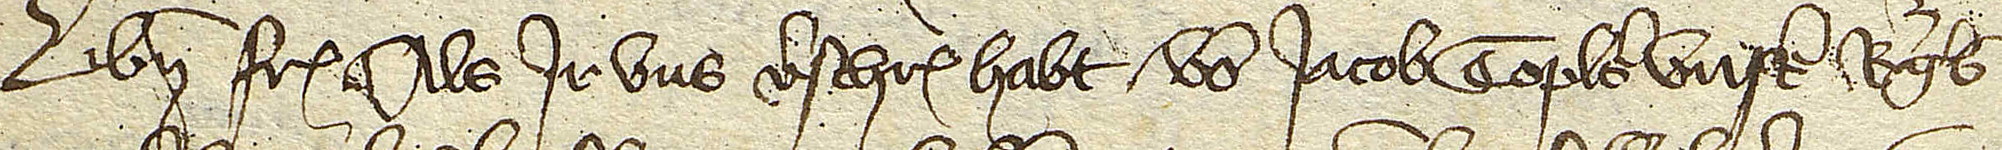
Liebn* fr* / Als Ir vns v*ſchr* habt / vo* Iacob Topls* vnſs* B*g*s
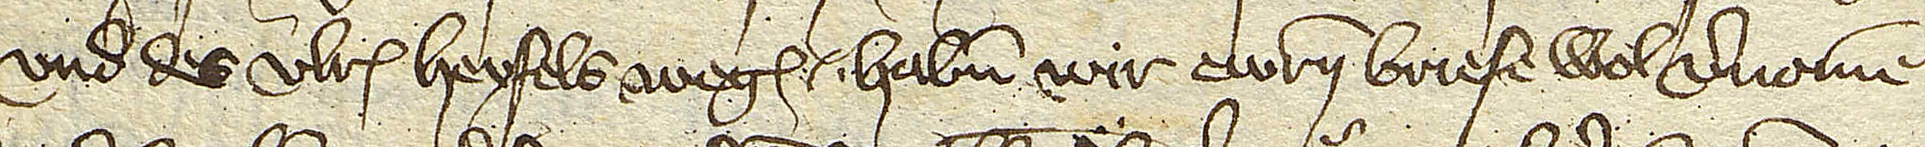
vnd des vlr* heyfels weg* / . habn* wir ewrn* briefe wol v*nome*
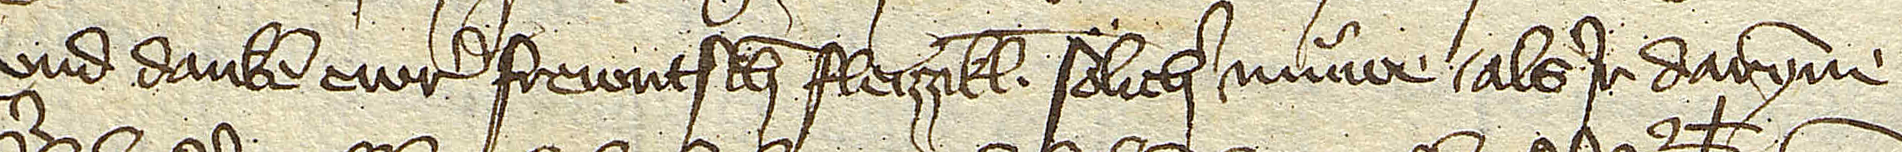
vnd danke ewr* frewntſch* fleiʒʒikl* . ſölich* müwe / als Ir daryne*
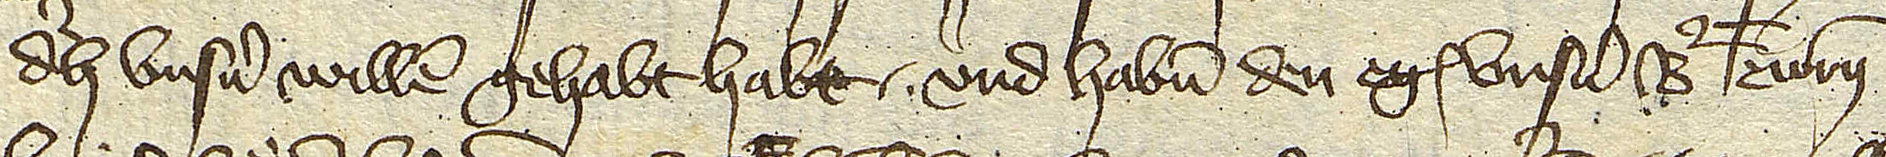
d*h vnſn* wille* gehabt habt / . vnd habn* den eg* vnſn* B* ewrn*
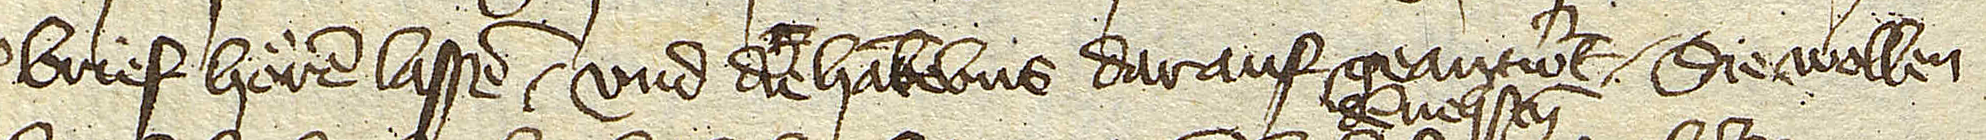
brief höre* laſſe* / vnd die habe* vns darauf geantwt* / . Sie wollen
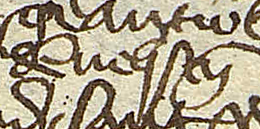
d* nehſtn*
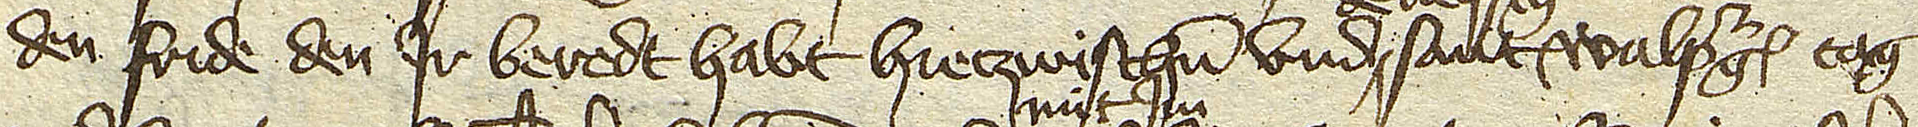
den fride den Ir beredt habt hiecʒwiſchn* vnd ſant walp*g* tag
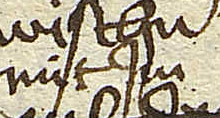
mit Im
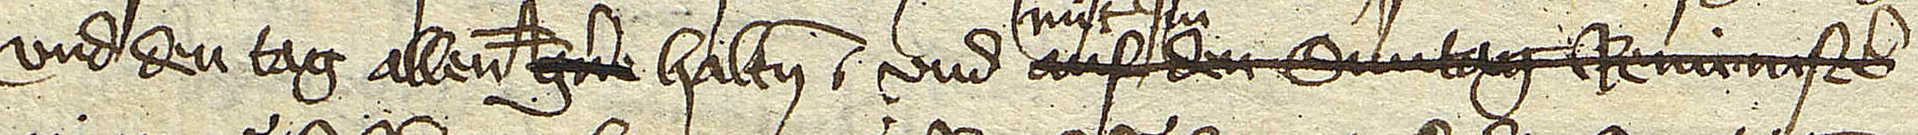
vnd den tag allen gn*e haltn* / vnd auf den Suntag Reminiſce*
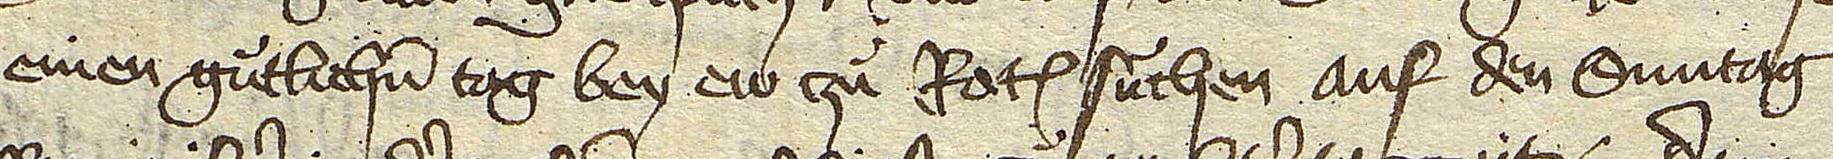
einen gütlichn* tag bey ew cʒü Rot* ſüchen auf den Suntag
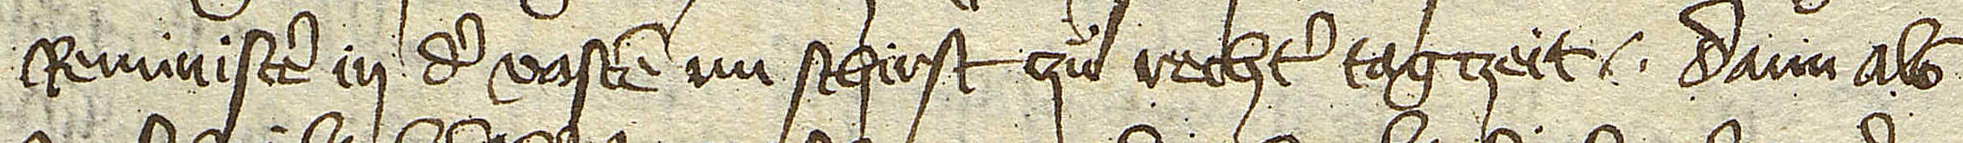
Reminiſce* in d* vaſte* nu ſchirſt cʒü recht* tag cʒeit / . Dann als
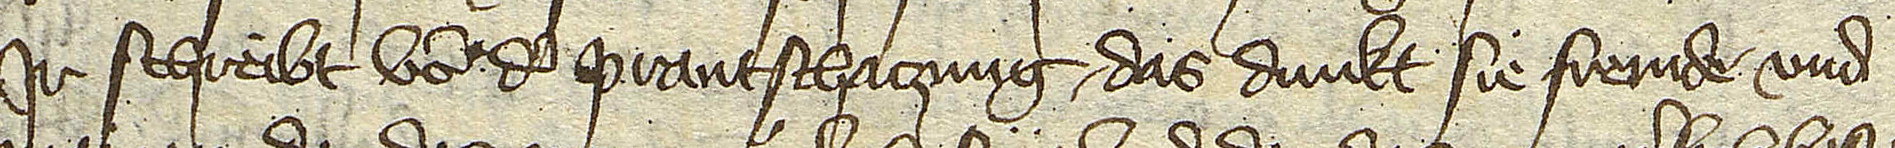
Ir ſchreibt vo* d* prantſchacʒung / das dunkt ſie fremde / vnd
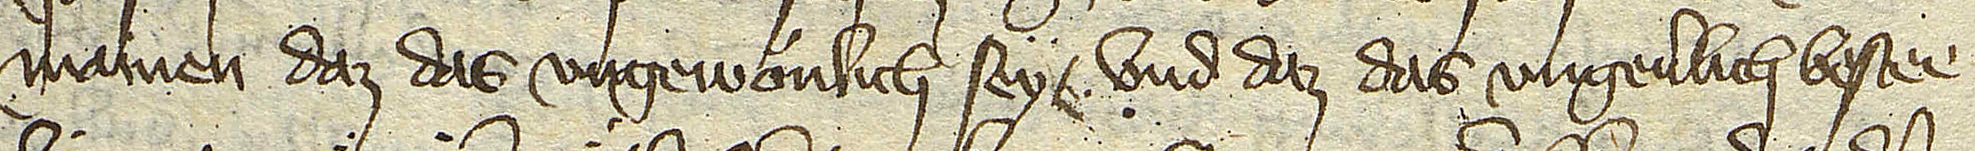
mainen daʒ das vngewönlich ſey / . vnd daʒ das vngeu*lich beſtee
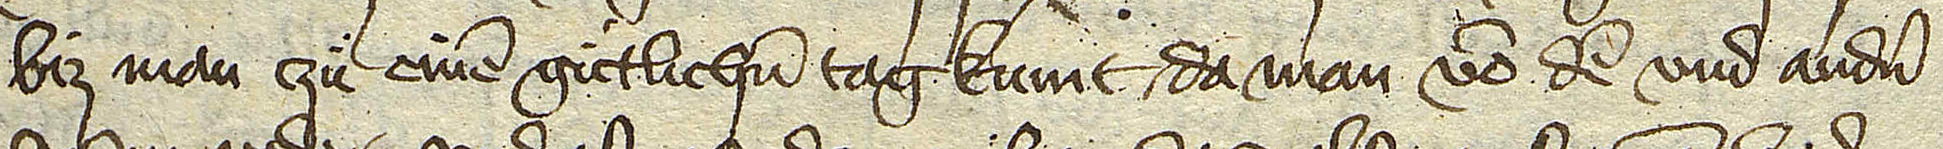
biʒ man cʒü eine* gütlichn* tag kumt / da man vo* d* vnd andn*
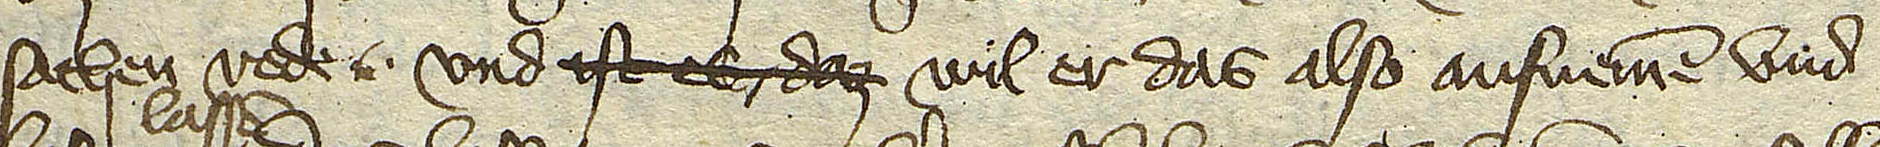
ſachen rede / vnd iſt es / daʒ wil er das alſo auſneme* vnd
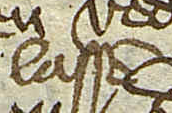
laſſe*
